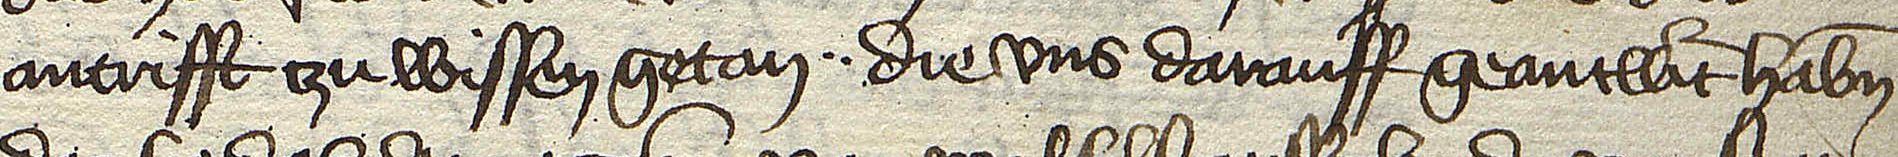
antrifft cʒu wiſſen getan ~ die vns darauff geantw*t hab*n
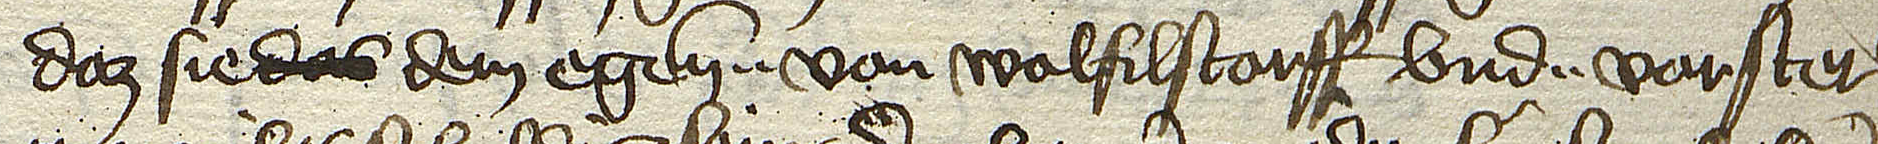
daʒ ſie das dem egen* ~ von wolfilſtorff vnd ~ vorſter
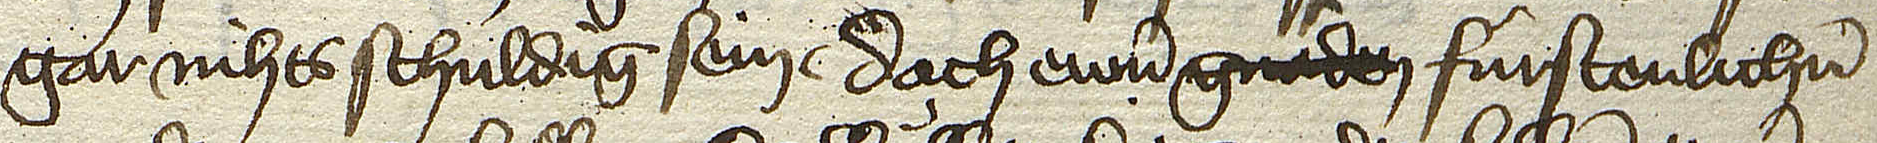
gar nihts ſchuldig ſein / doch ewn* gnaden fürſtenlich*n
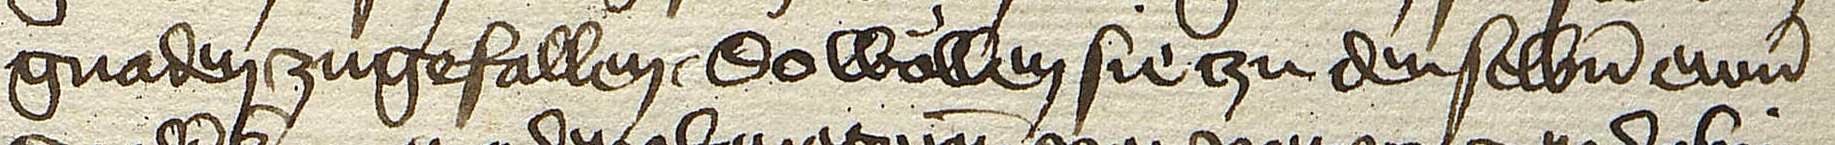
gnaden ʒugefallen / So wöllen ſie cʒu denſelben ew*n
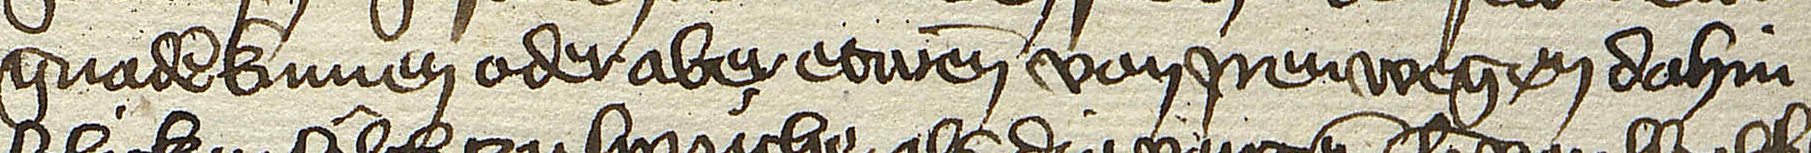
gnade* kumen oder aber etwen* von Iren wegen dahin
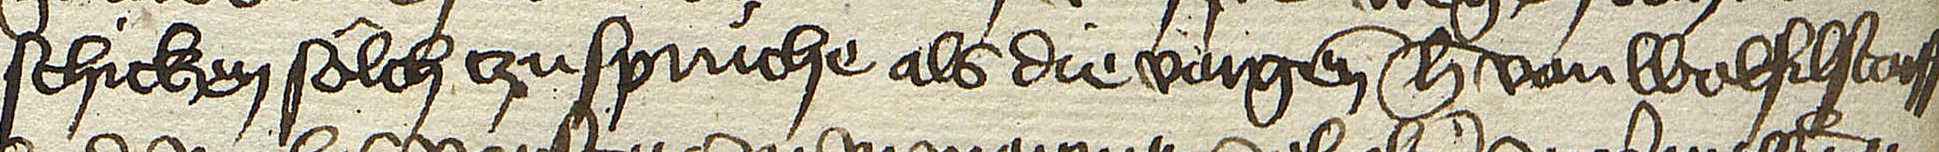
ſchicken ſölch cʒu ſprüche als die vorgen* h* von wolfilſtorff
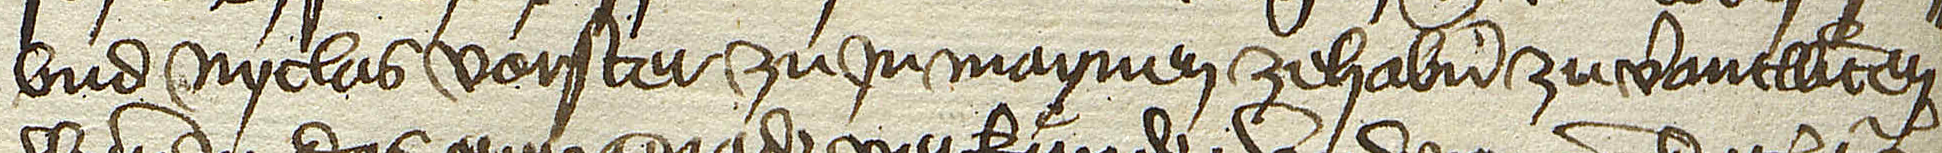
vnd Nyclas vorſter cʒu In maynen cʒehab*n cʒu v*antw*ten
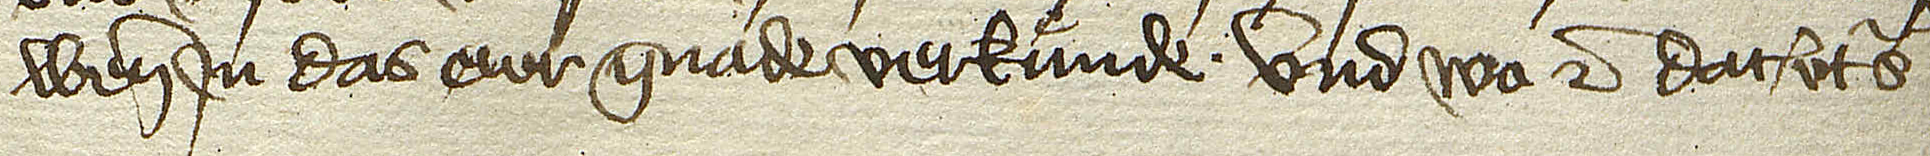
wen* In das ewr gnade verkünde . Vnd wo ec* dat* vt s*
